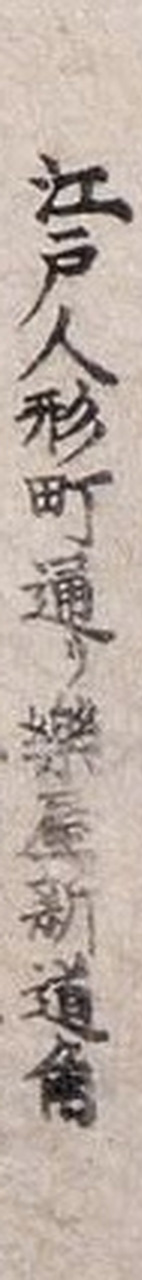江戸人形町通り楽屋新道角
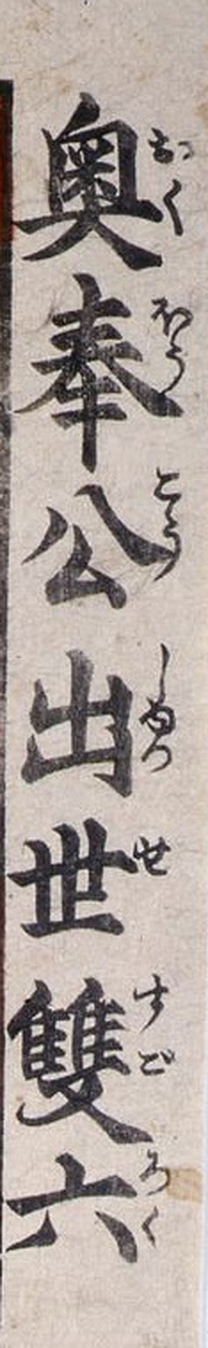奥奉公出世双六
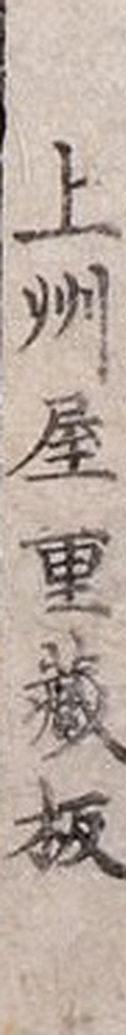上州屋重蔵板
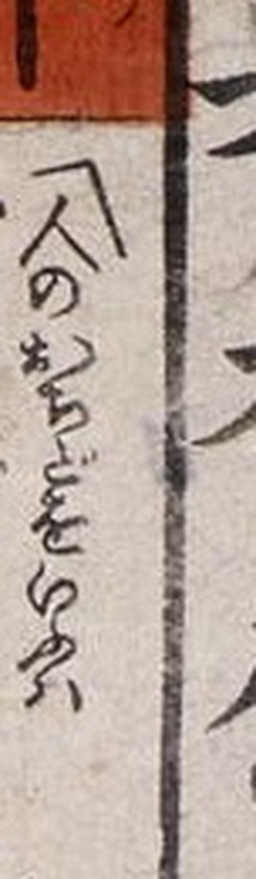〽人のおちどをいふは
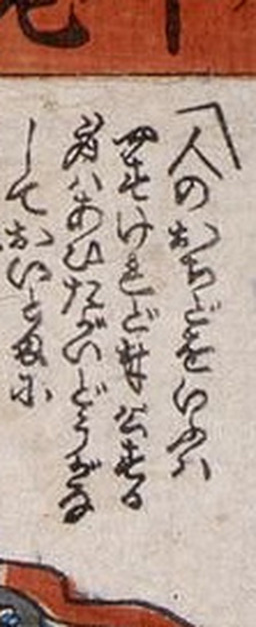やすけれど奉公する
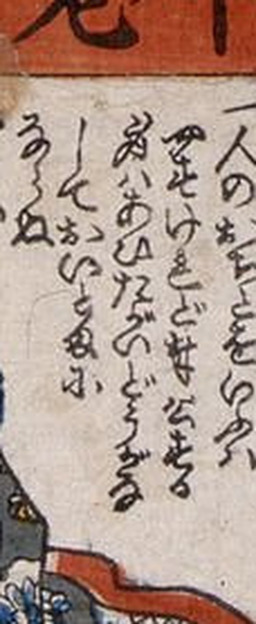身はあひたがいどうがな
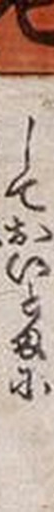しておいとまに
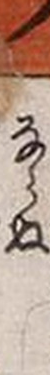ならぬ
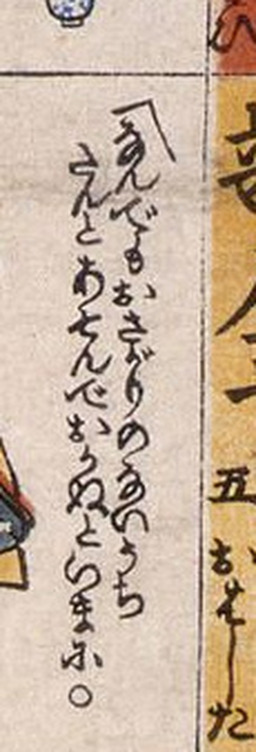〽なんでもおさがりのないうち
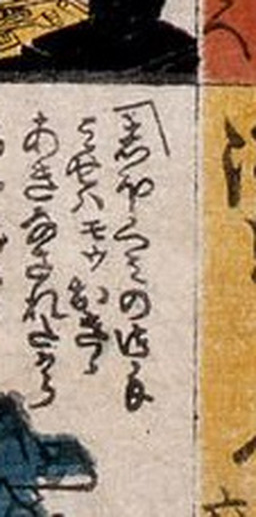〽しほくみの御手
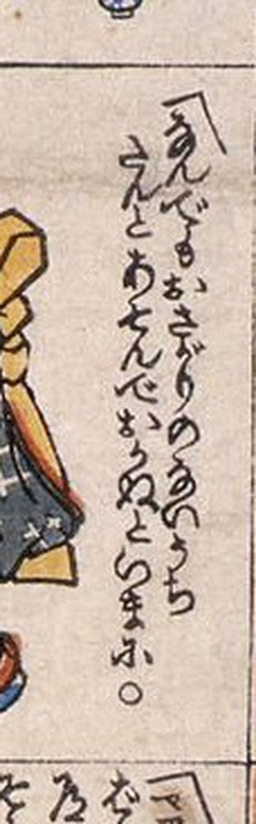たんとあそんでおかぬといまに○
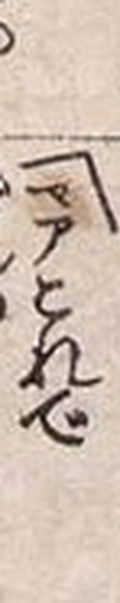〽マアこれで
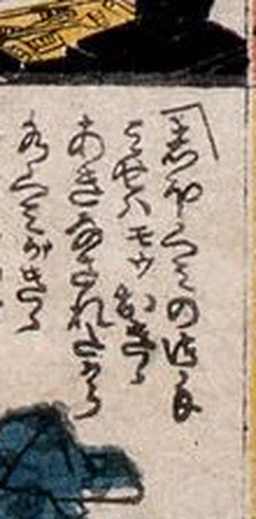みせはモウおきゝ
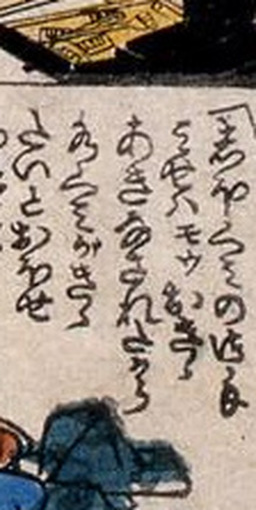あきなされたから
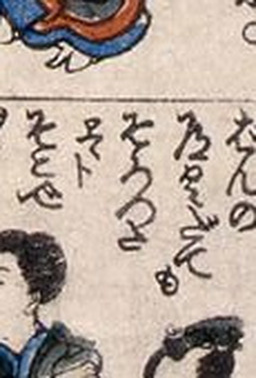そろつた
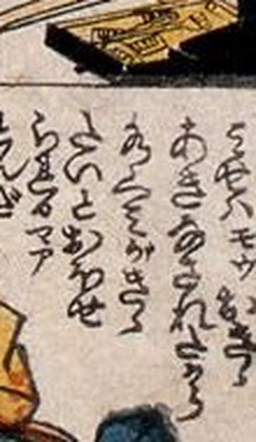水くみがきゝ
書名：奥奉公出世双六
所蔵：東京学芸大学教育コンテンツアーカイブ
